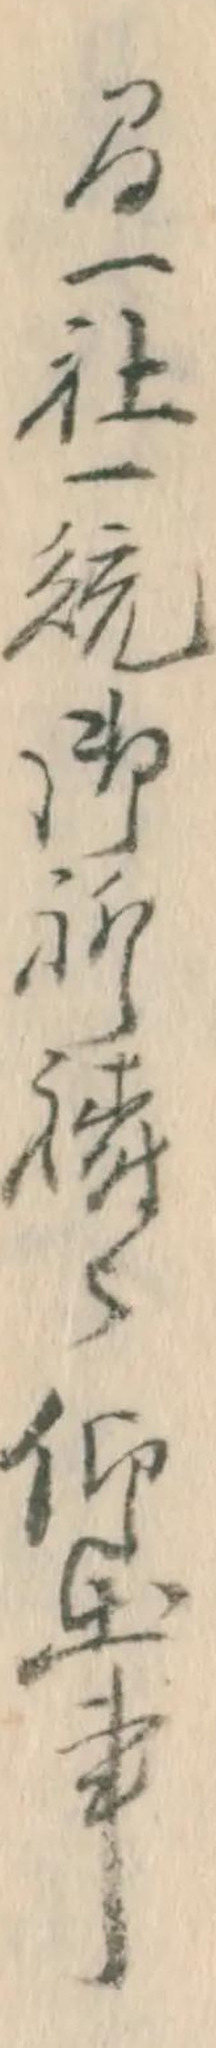間一社一統御祈祷被仰出事
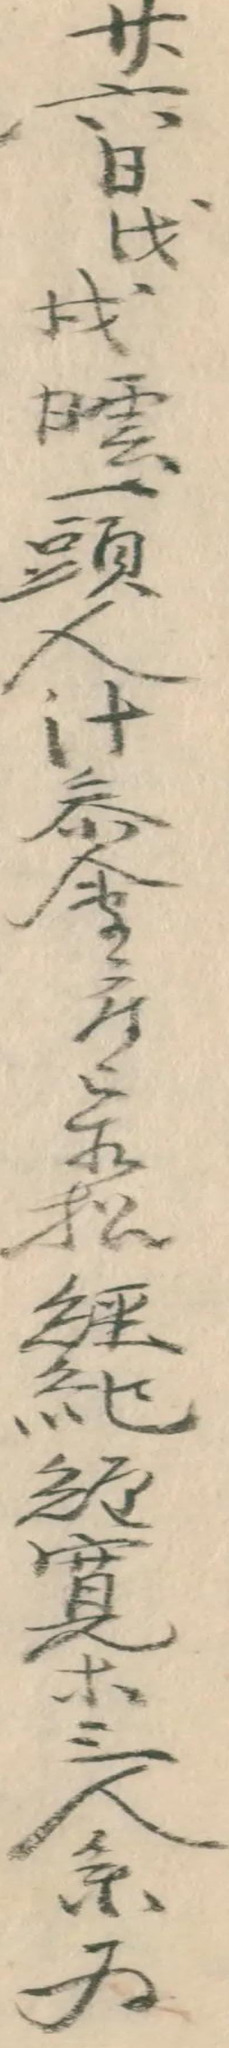廿六日戊戌曇一頭人汁参會ニ付被相招経紀経寛等三人参為
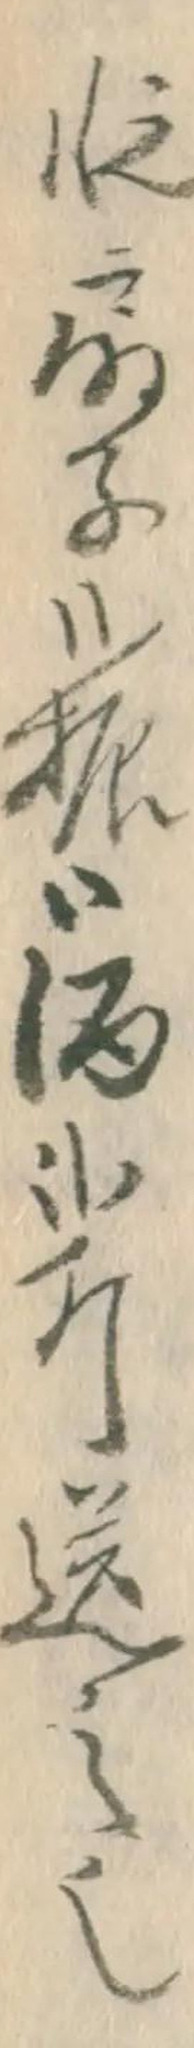祝扇子弐振御酒弐升送之也

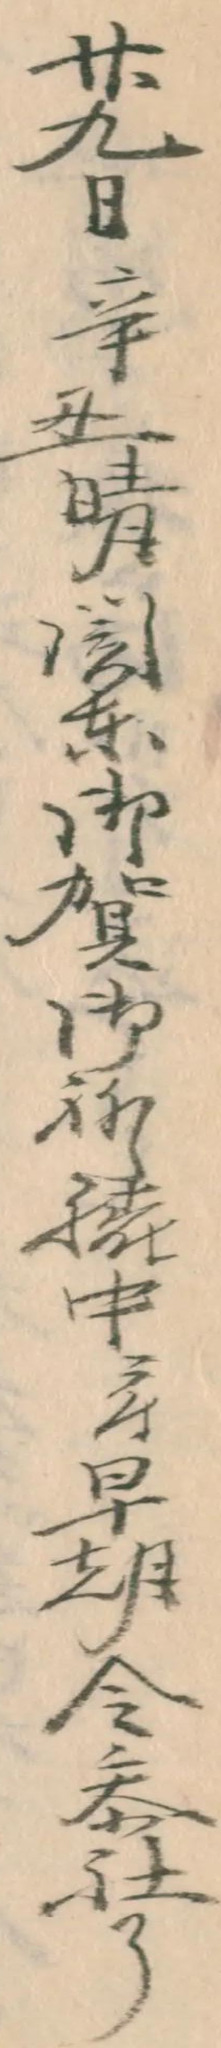廿九日辛丑晴関東御賀御祈祷中ニ付早朝令参社了
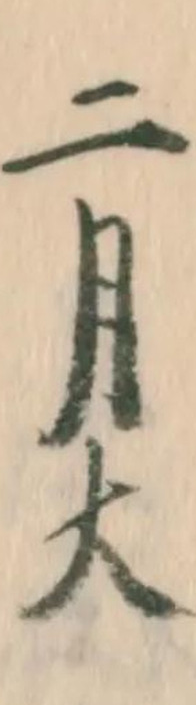二月大
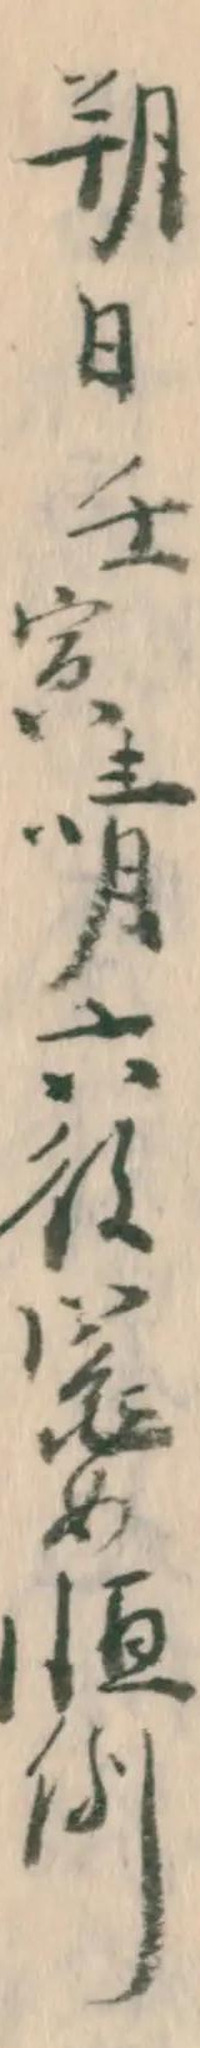朔日壬寅年明六役鬮如恒例
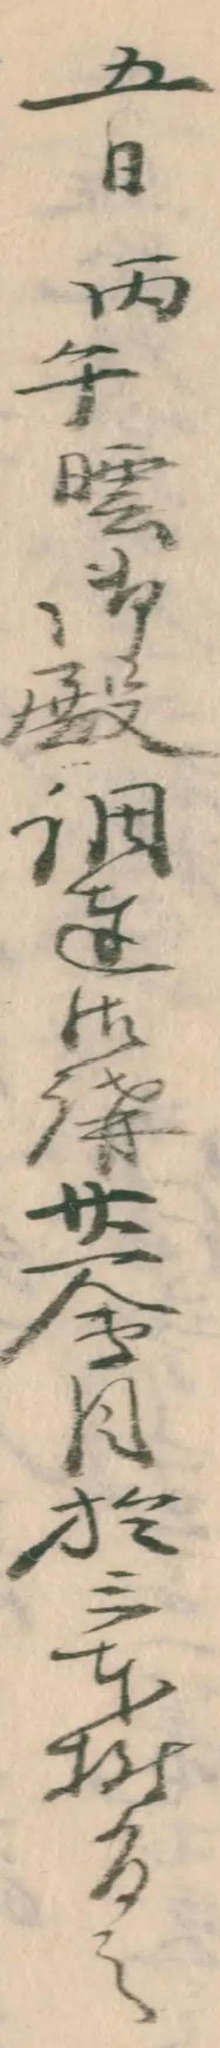五日丙午曇御殿調達御講廿一會目於三本樹有之
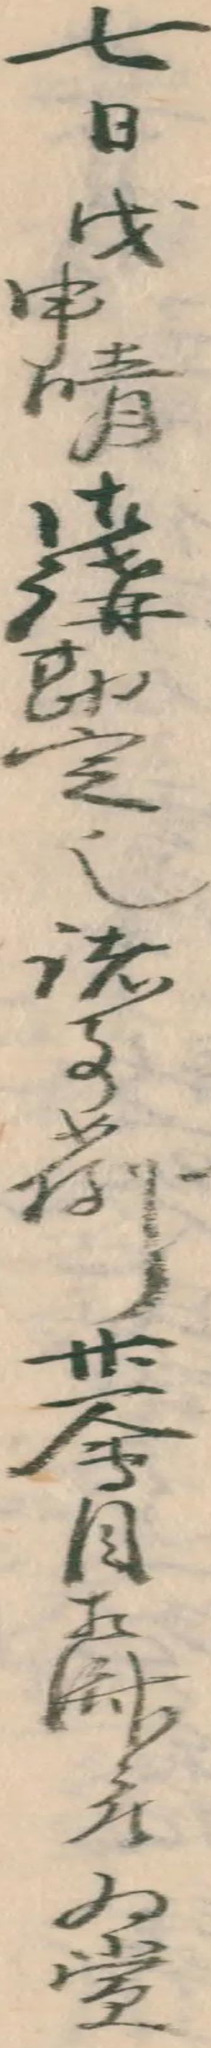七日戊申晴御講勘定也諸事如例廿一會目相済ニ付為堂
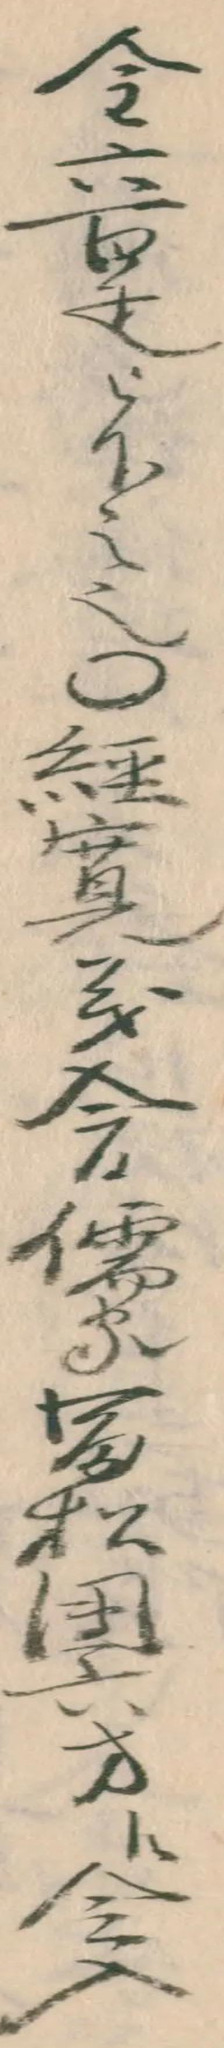金六百疋被下之也○経寛義今儒家冨松團六方え令入
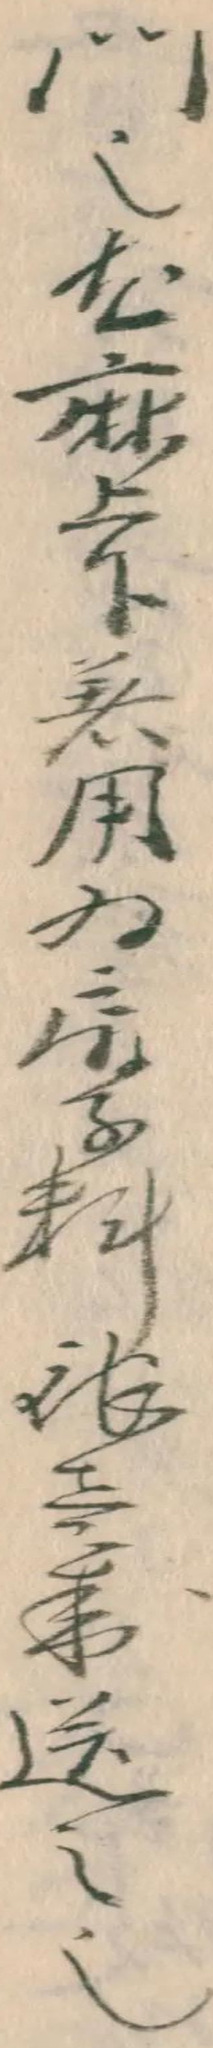門也尤麻上下着用為扇子料銀壱朱送之也
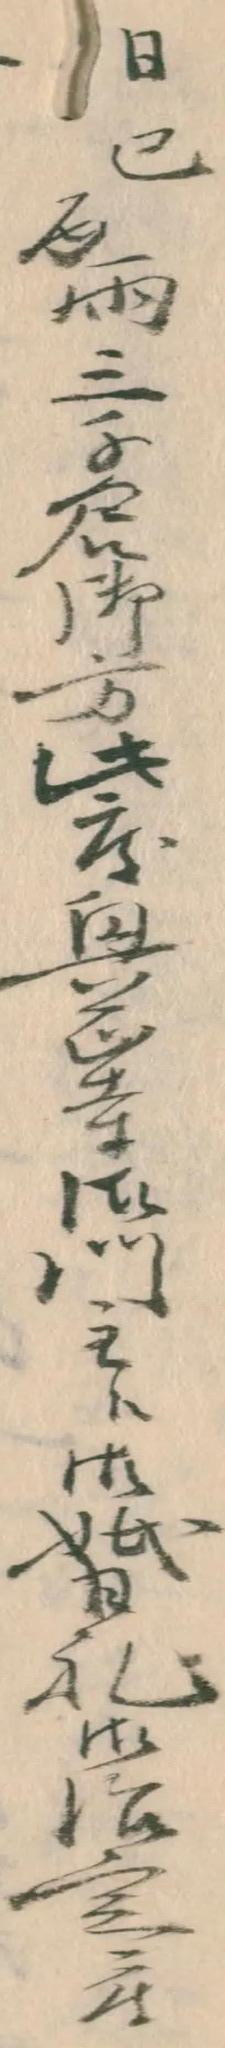八日己酉雨三千君御方此度興正寺御門主え御婚礼御治定ニ付
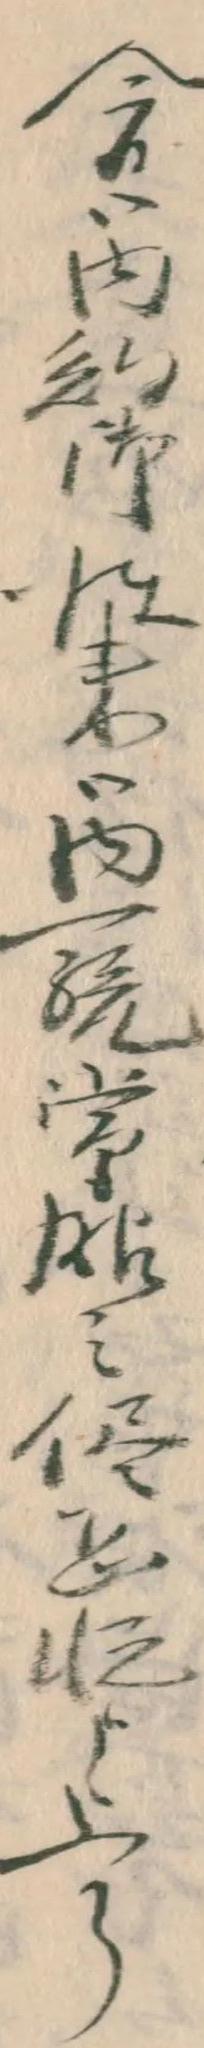今日御内約御往来御内一統常服之侭恐悦申上了
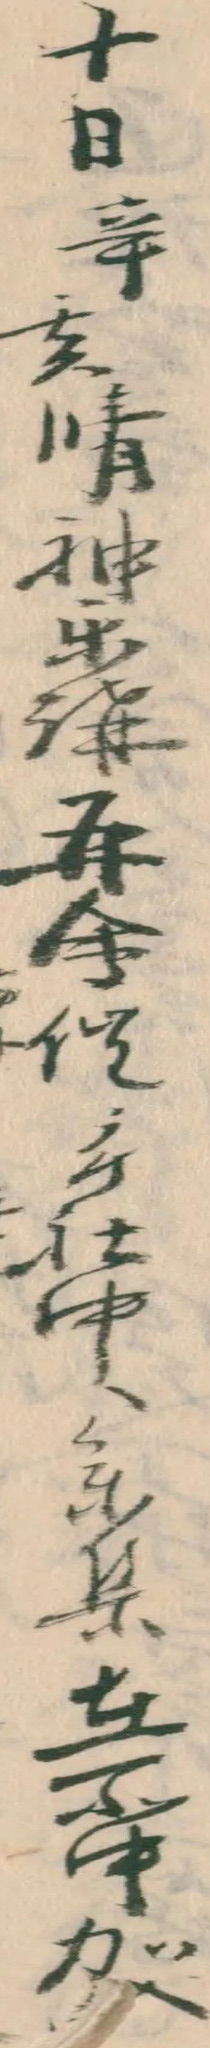十日辛亥晴神楽講再會催ニ付社中へ参集在所中加入
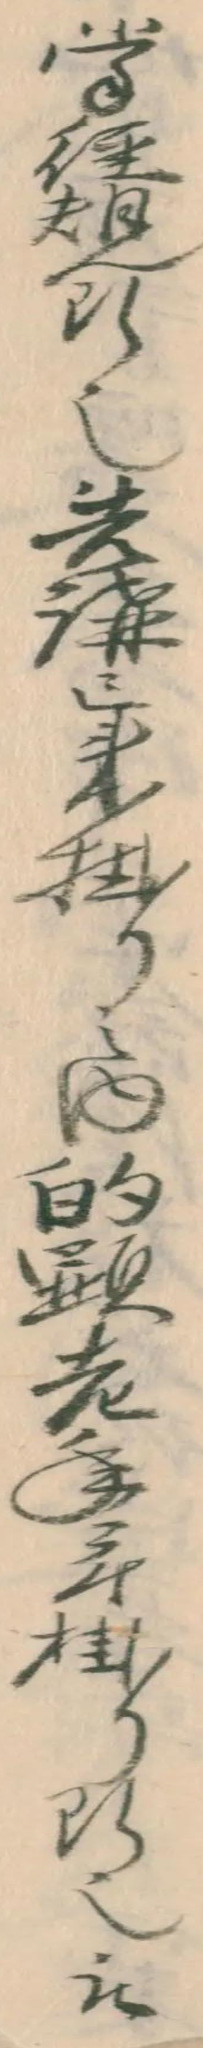掌経規断也先講已来掛り之内的顕老年ニ付掛り断也被
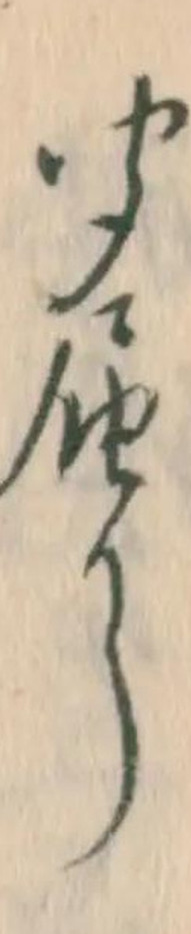聞届了
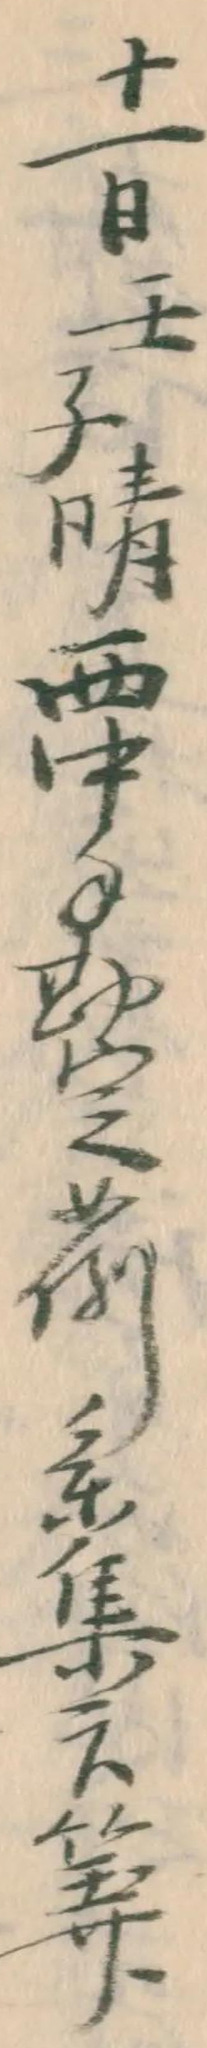十一日壬子晴西中手勘定如例参集算
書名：賀茂社記録. 第66冊
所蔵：国立国会図書館 National Diet Library, JAPAN
